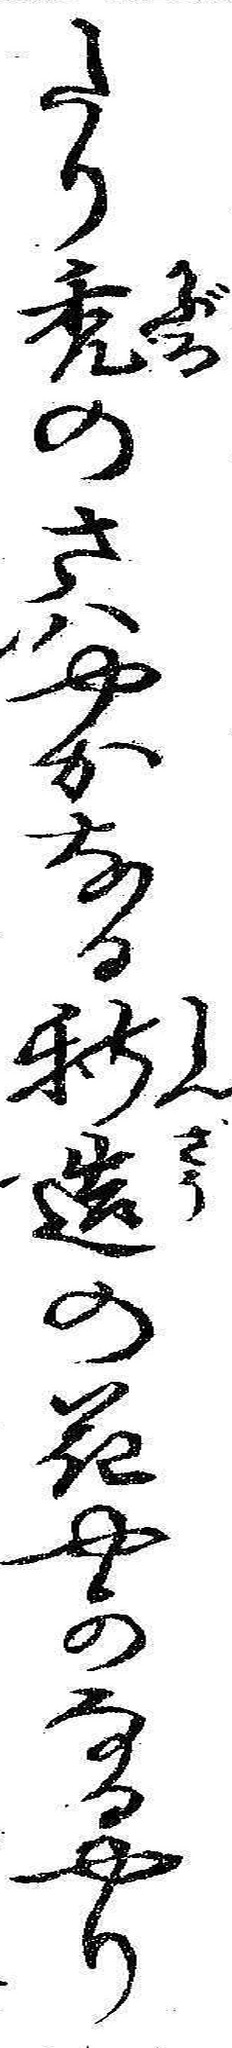たり禿のさはやかなる新造の花やかなるやり
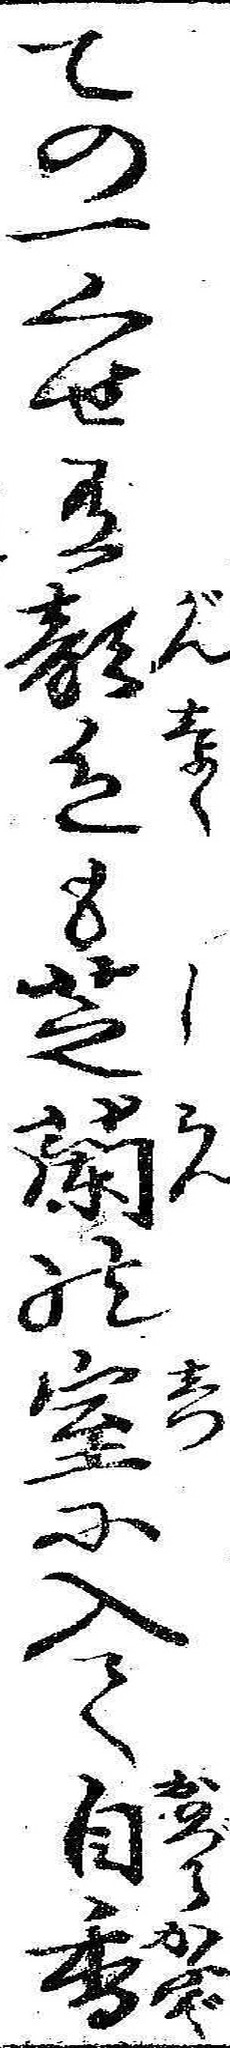ての一くせ有顔色も芝蘭の室に入て自香
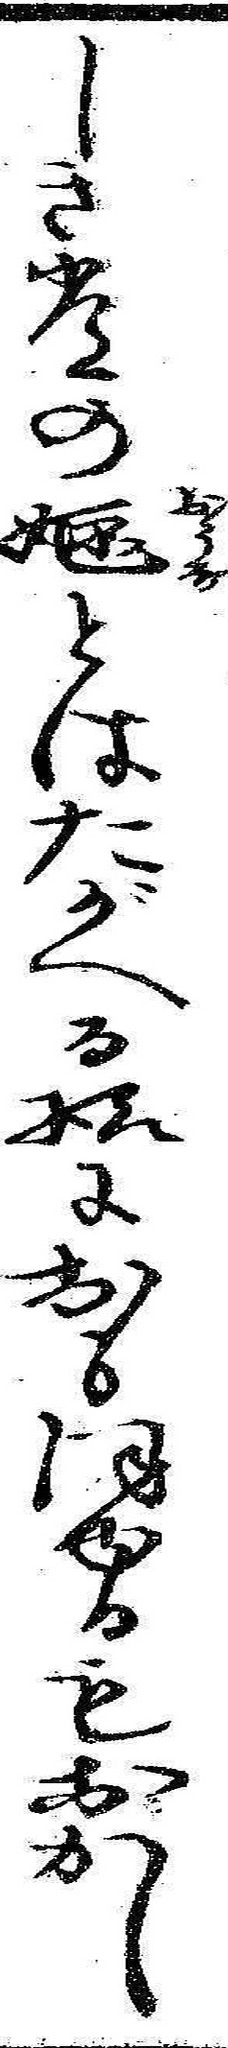しき常の嫗とはたがへる様におもほゆるもおかし

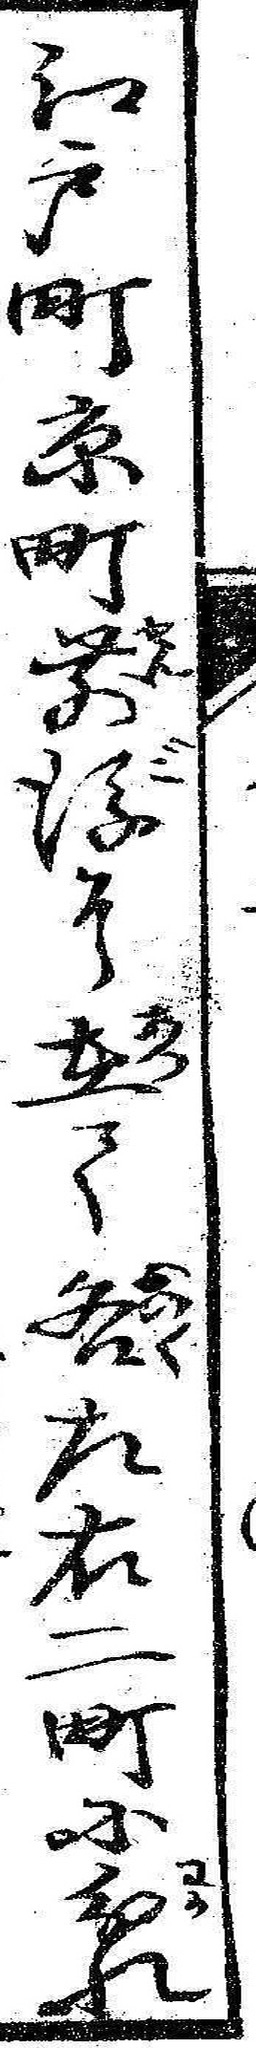江戸町京町前後に在て各左右二町に分れ
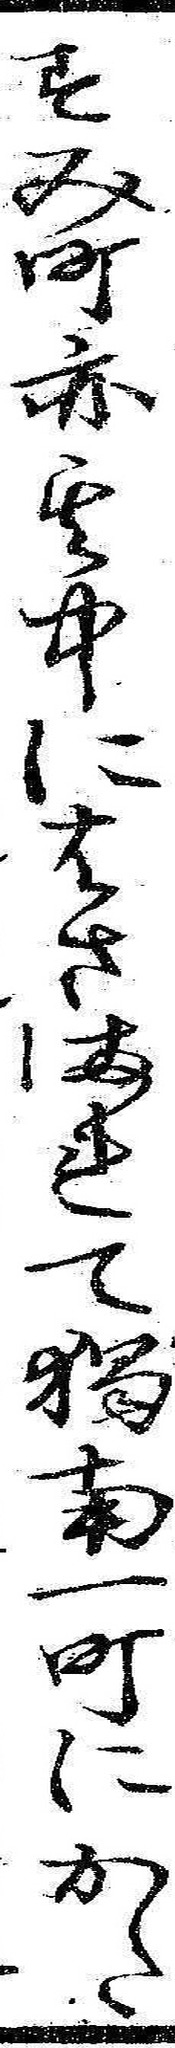すみ町亦其中にはさまれて独南一町にかた
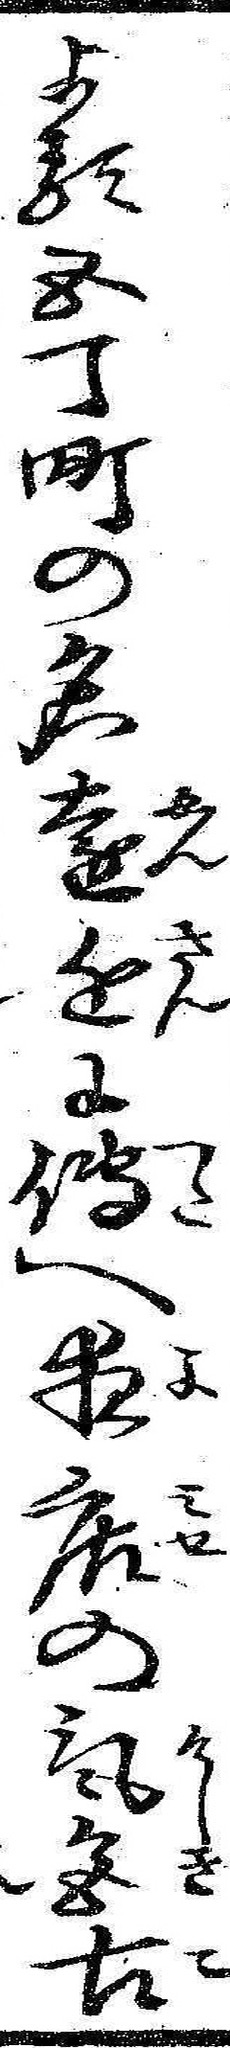よる五丁町の名遠近に伝へ夜店の気色古
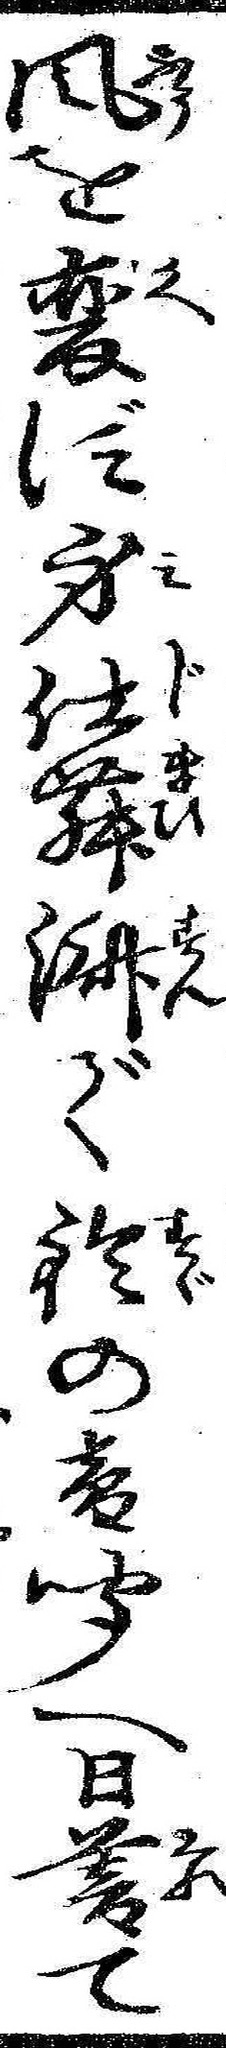風を変ず身仕舞済で鈴の音聞へ日暮て
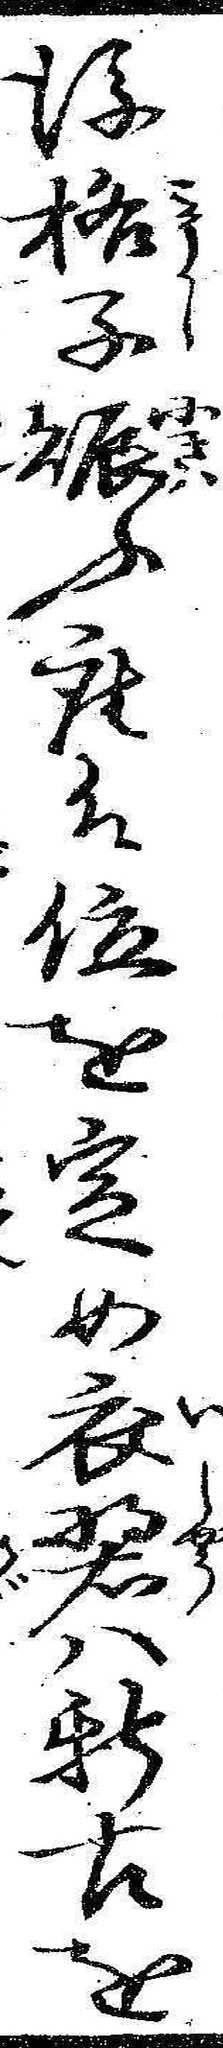後格子賑ふ座は位を定め衣装は新古を
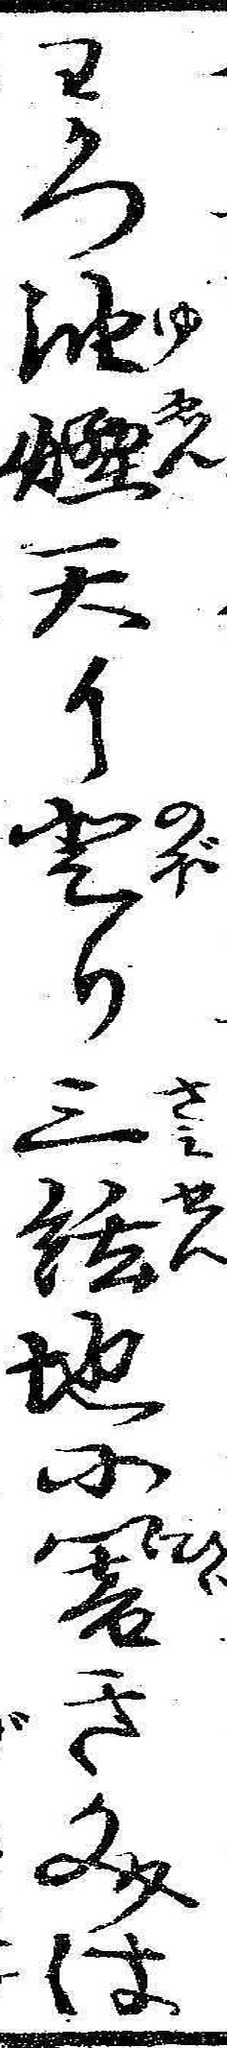わかつ油煙天に登り三絃地に響き文は
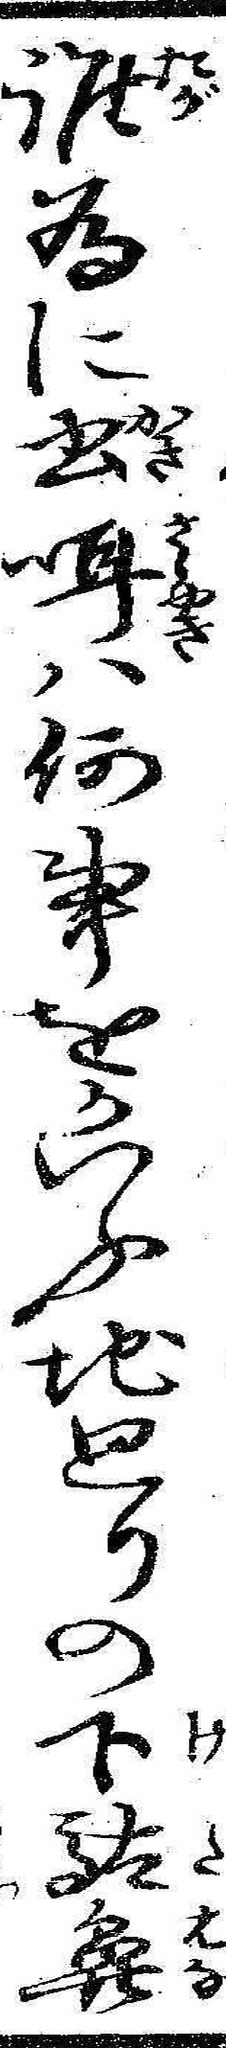誰為に書囁は何事をかいふ地廻りの下駄鼻
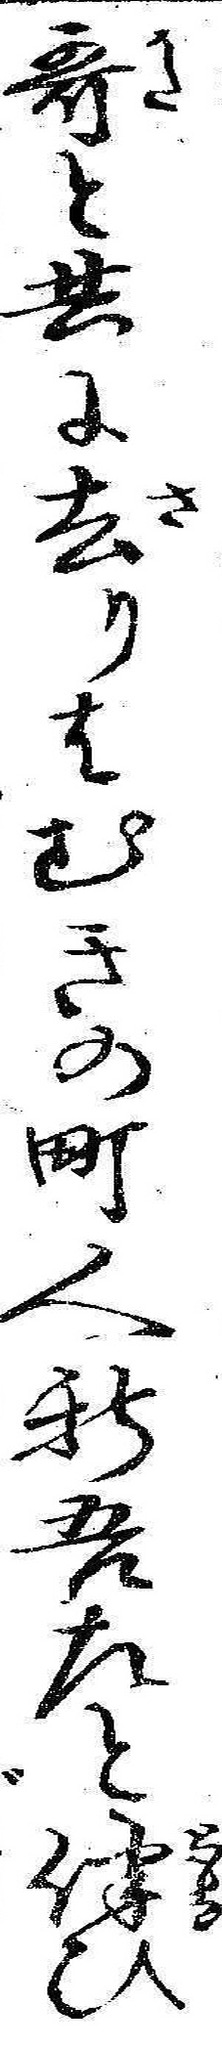哥と共に去りはむきの町人新吾左と伴ひ
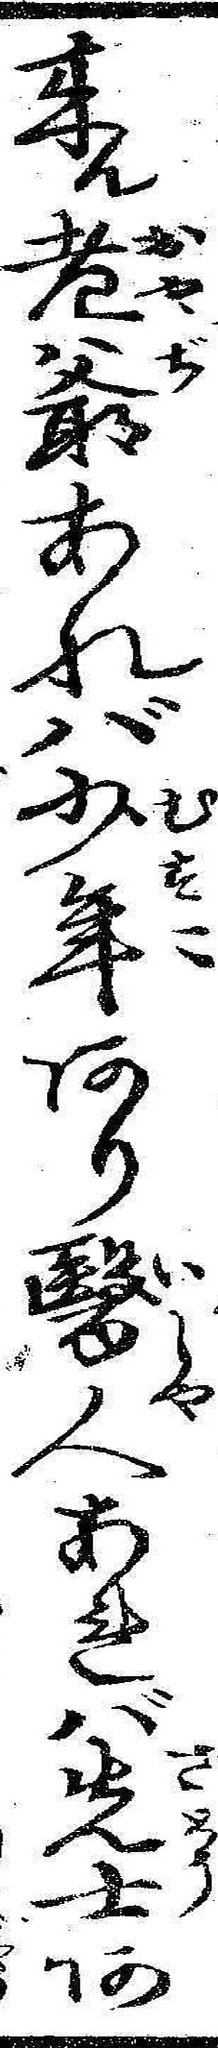来老爺あれば少年あり医人あれば先士あ
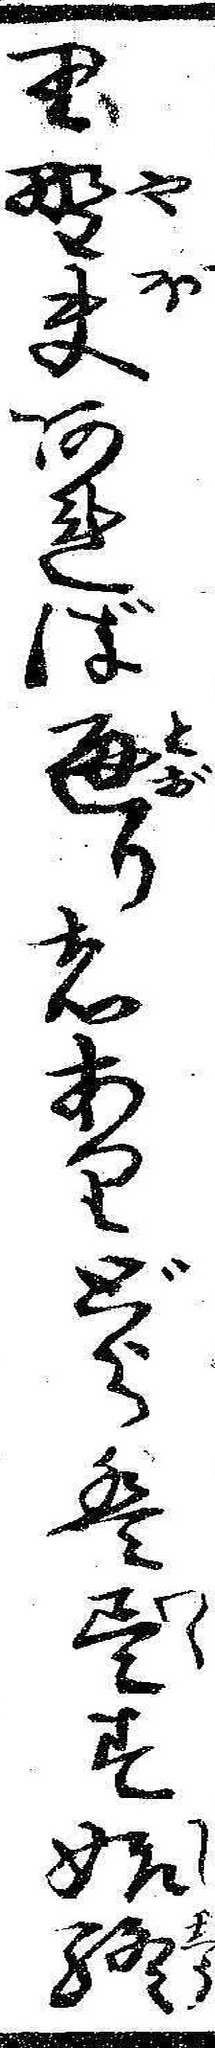り野夫あれば通り者ありどらは尽す始終
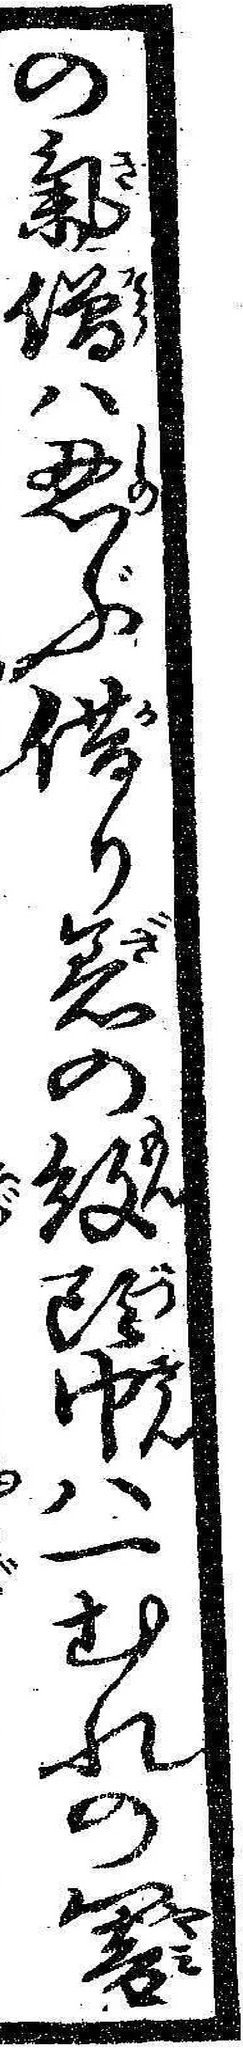の気僧は忍ぶ借り着の紋頭巾は一むれの闇
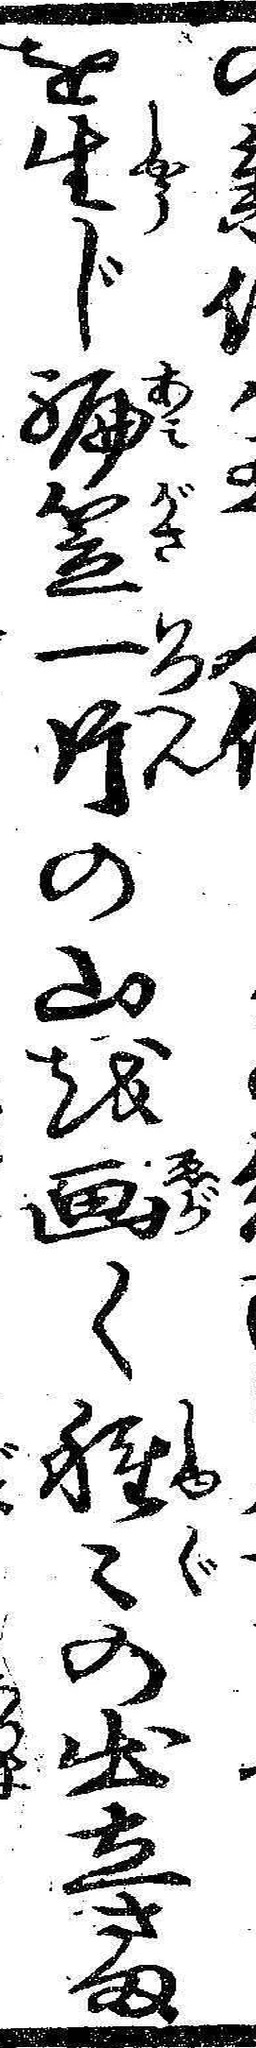を生じ編笠一片の山を画く種々の出立さま
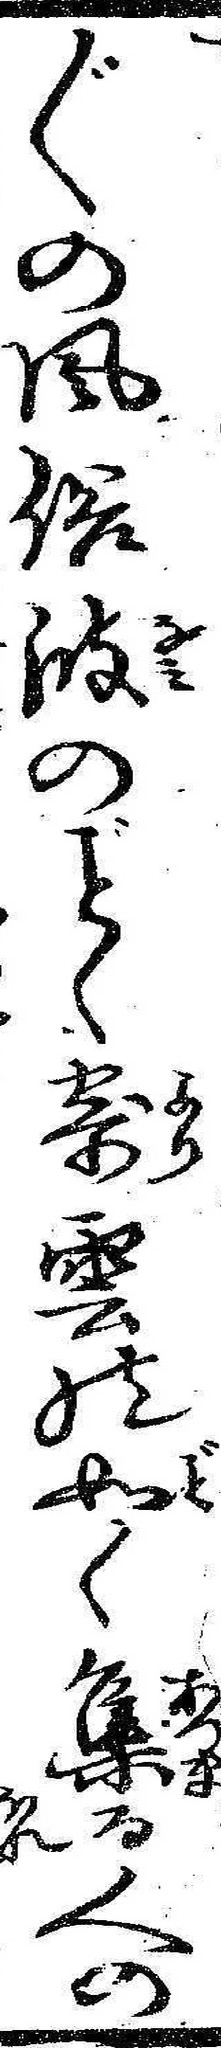〲の風俗波のごとく寄雲の如く集る人の
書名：根無草後編
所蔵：国文学研究資料館
